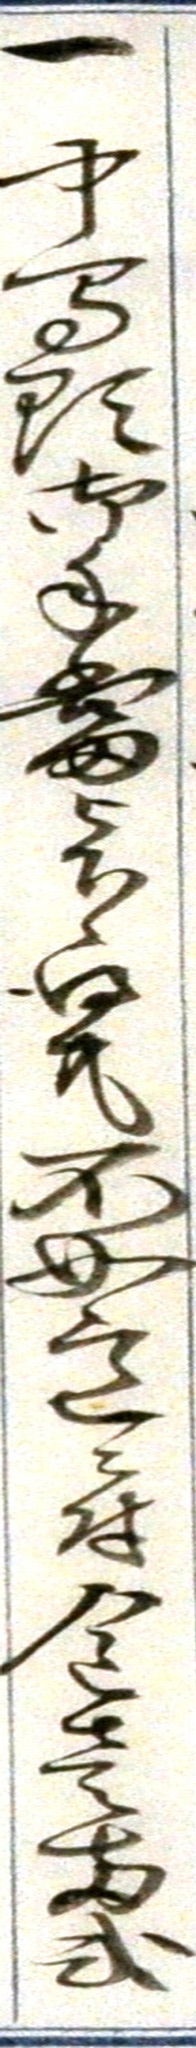一中間頭御手当被下候得共不如意ニ付金壱両弐
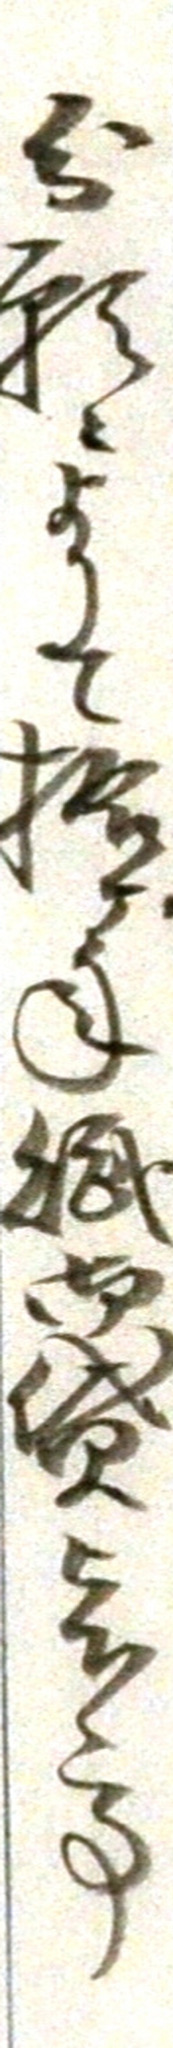分願ニよりて拾ケ年賦御貸被下候事
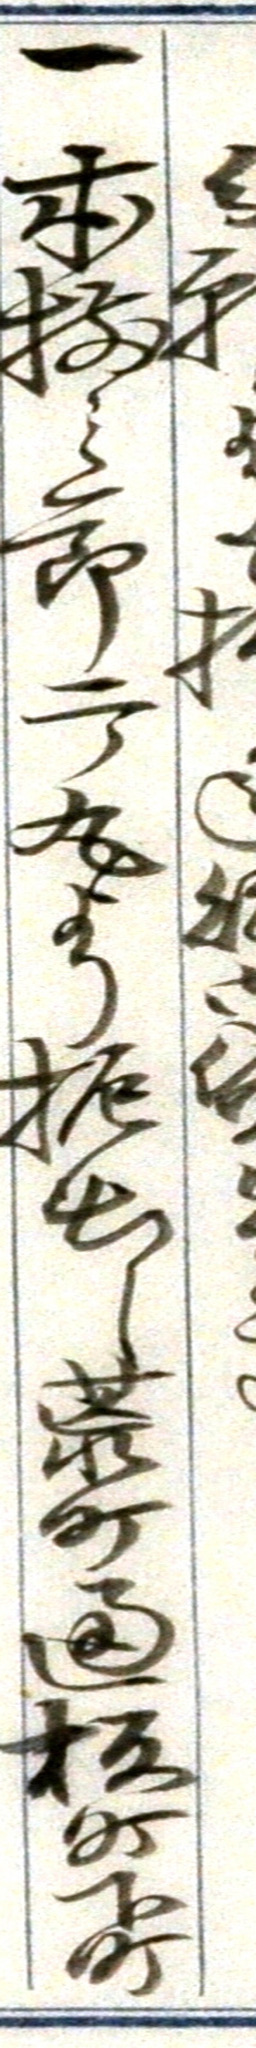一本揃之節二ノ丸より振出し荒町通板町下町
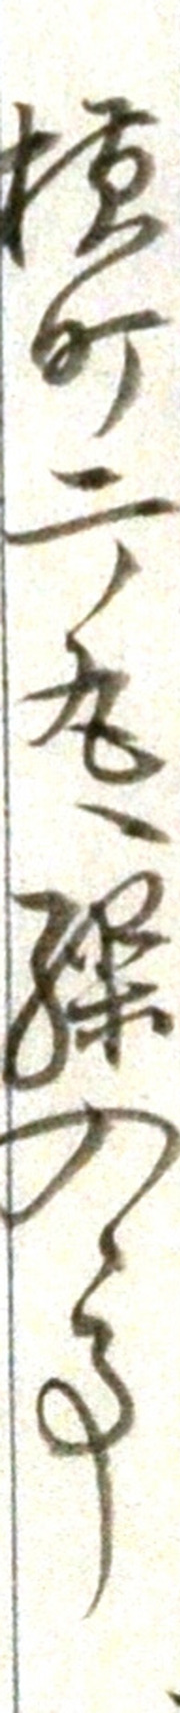横町二ノ丸へ繰入候事
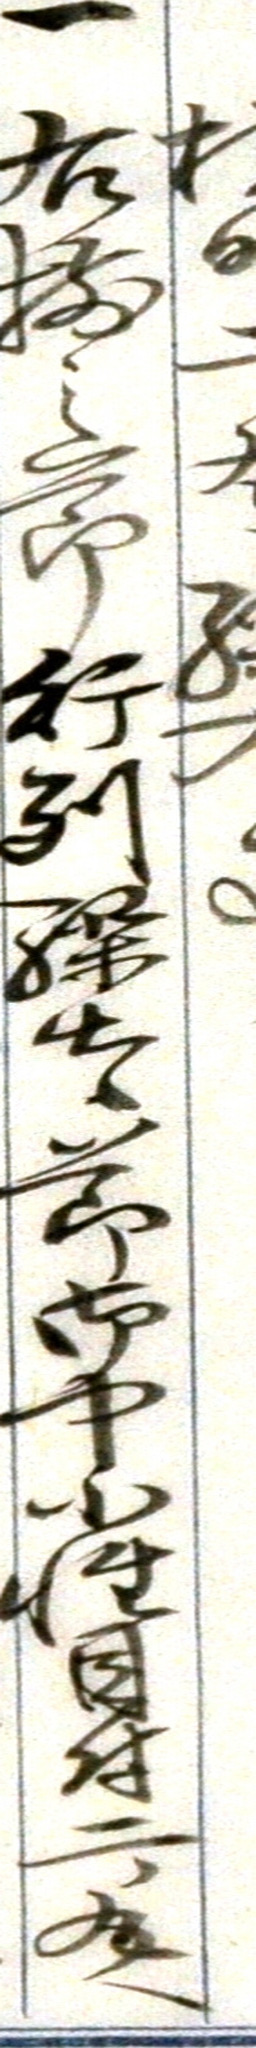一右揃之節行列繰出候節御中小性目付二ノ丸へ
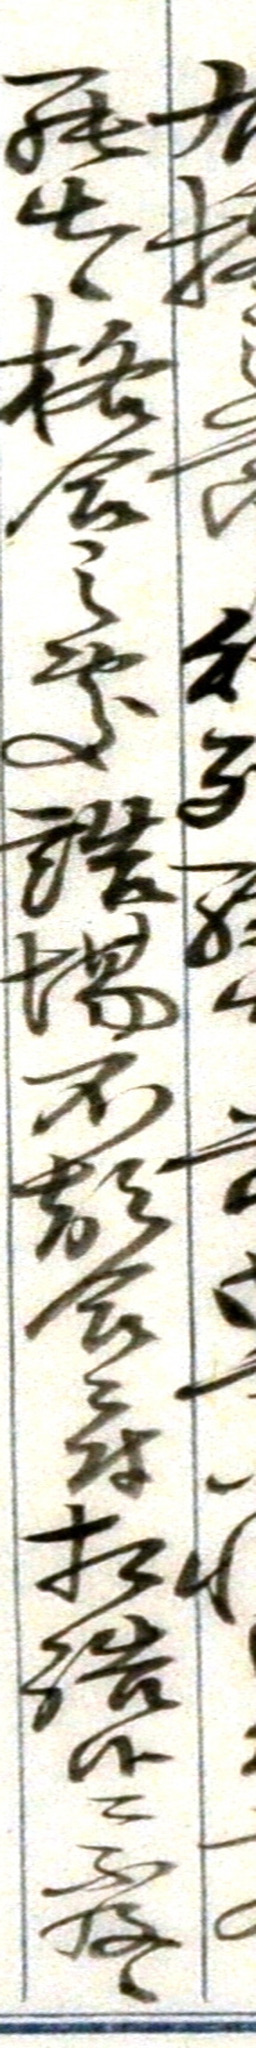罷出候格合之処詰場不都合ニ付相詰候ニ不及候
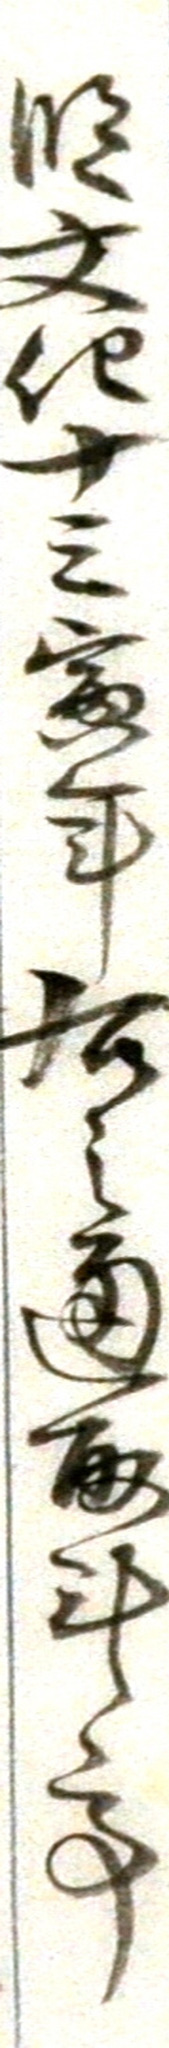段文化十三寅年右之通取計候事
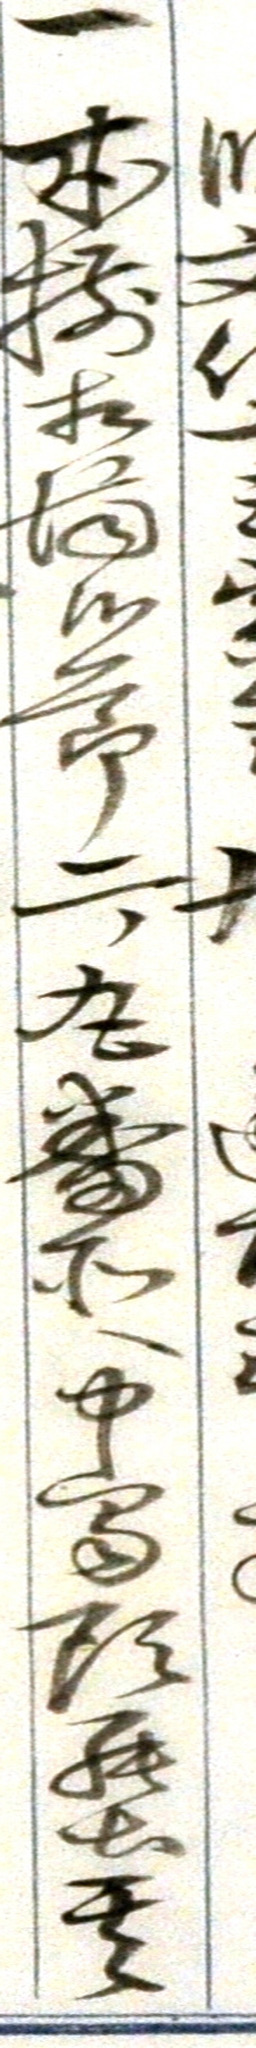一本揃相済候節二ノ丸番所へ中間頭罷出其
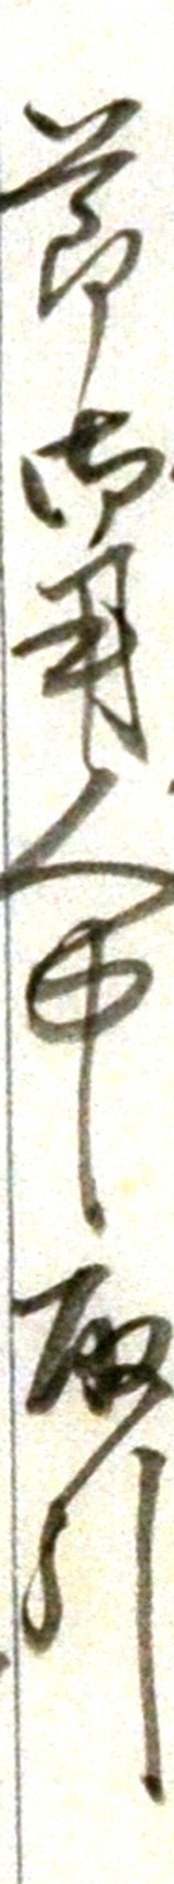節御用人中取引
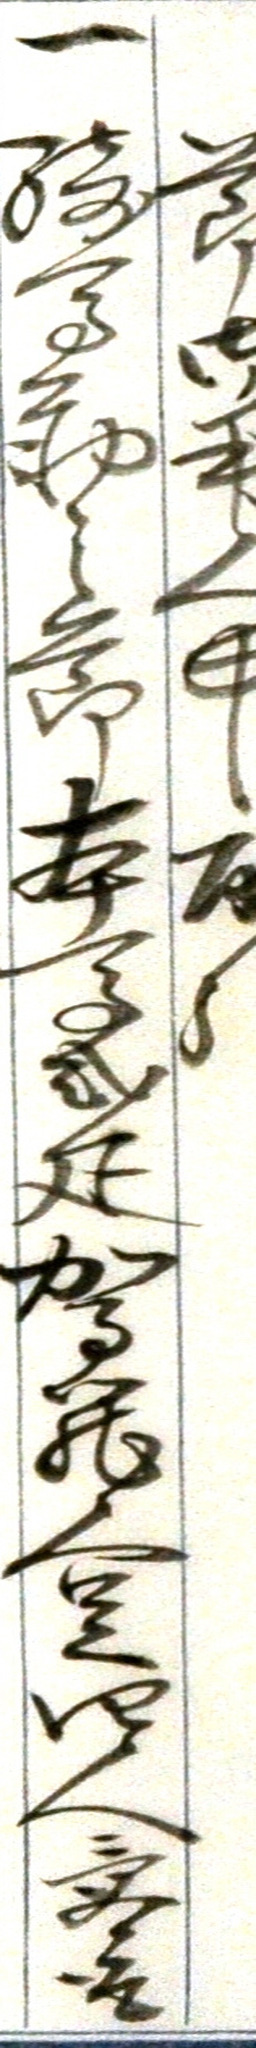一騎馬勤之節本馬弐疋駕籠人足四人受取
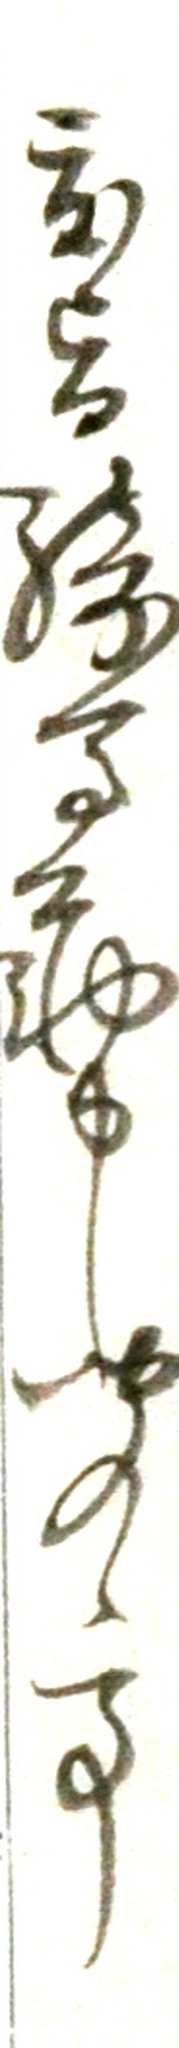度旨騎馬勤申聞候事

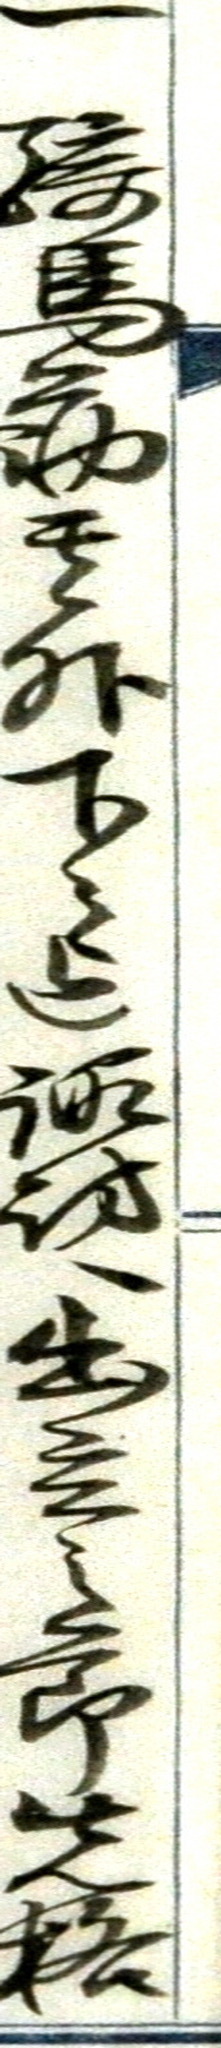一騎馬勤其外下々迄諏訪へ出立之節先格
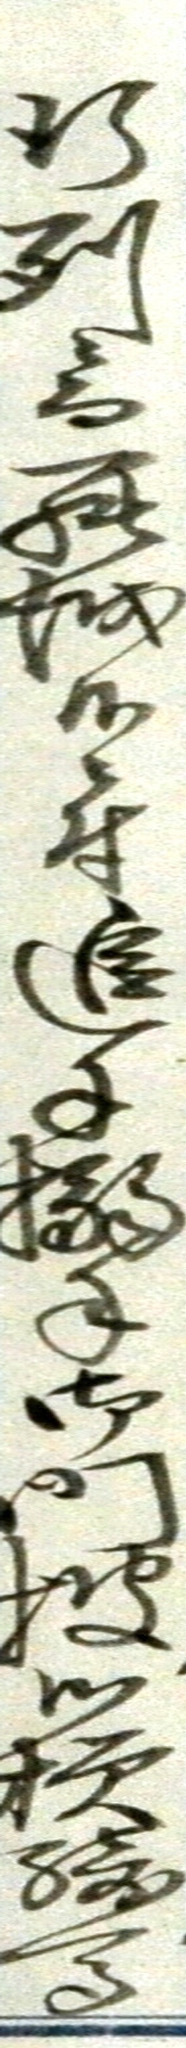行列ニ而罷越候ニ付追手搦手御門披候様騎馬
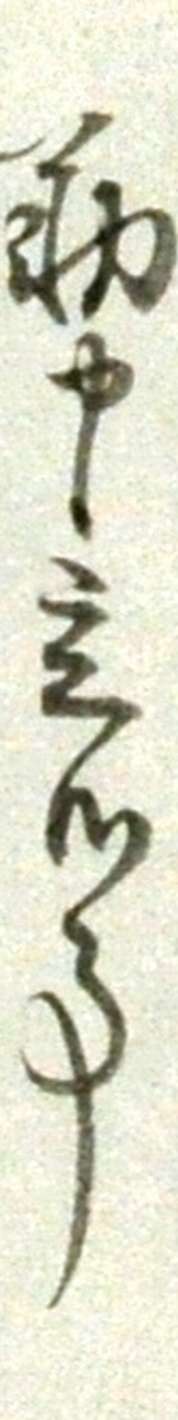勤申立候事
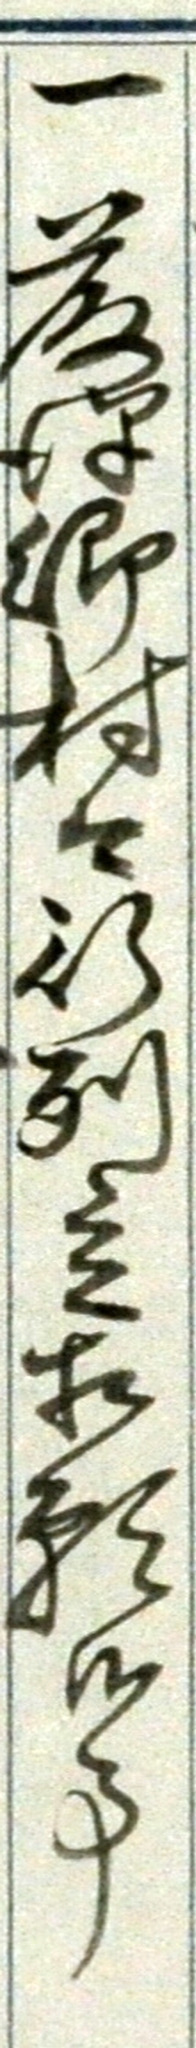一藤澤郷村々行列立相願候事
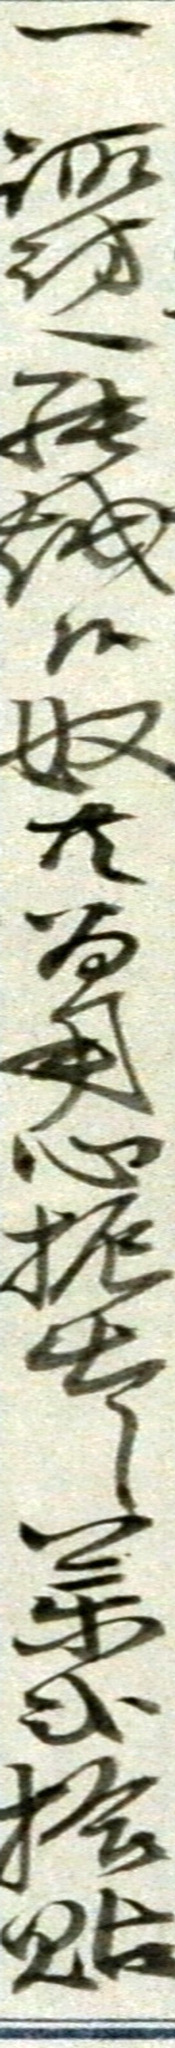一諏訪へ罷越候奴共為用心振出し薬弐拾貼
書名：諏訪御柱祭之節・騎馬大将御中間頭・御柱引人足
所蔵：伊那市立高遠町図書館・合同会社AMANE
